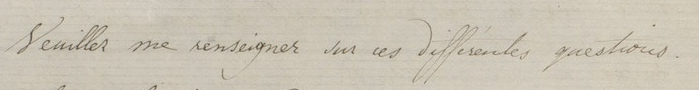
Veuillez me renseigner sur ces différentes questions.
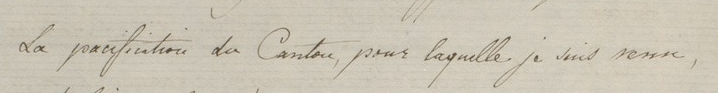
La pacification du Canton, pour laquelle je suis venu,
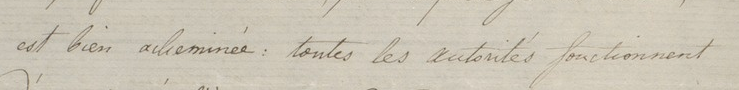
est bien acheminée: toutes les autorités fonctionnent
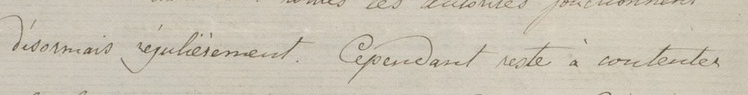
désormais régulièrement. Cependant reste à contenter
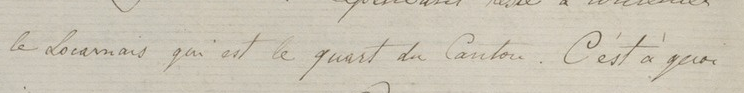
le Locarnais qui est le quart du Canton. C'est à quoi
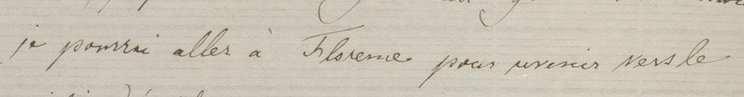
je pourrai aller à Florence pour revenir vers le
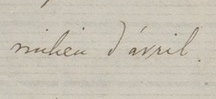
milieu d'avril.
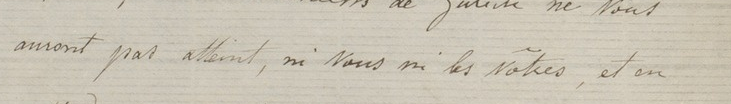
auront pas atteint, ni Vous ni les Vôtres, et en
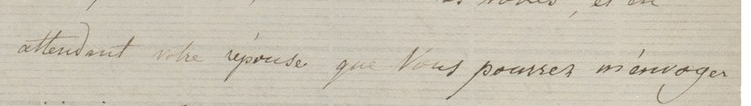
attendant Votre réponse que Vous pourrez m'envoyer
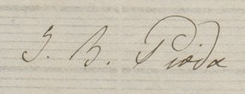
J. B. Pioda
